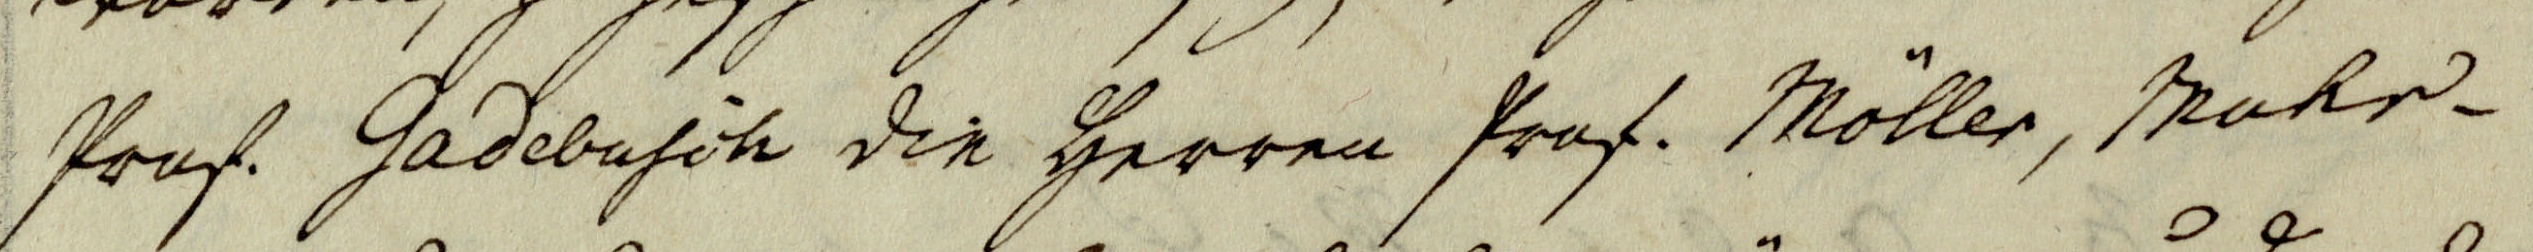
Prof. Gadebusch die Herren Prof. Möller, Muhr¬
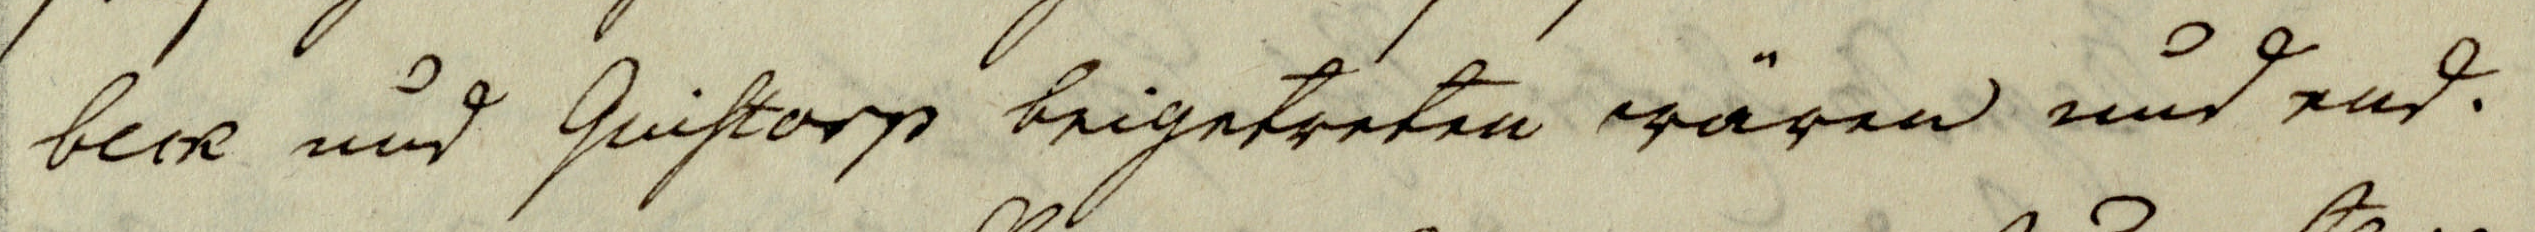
beck und Quistorp beigetreten wären und end¬
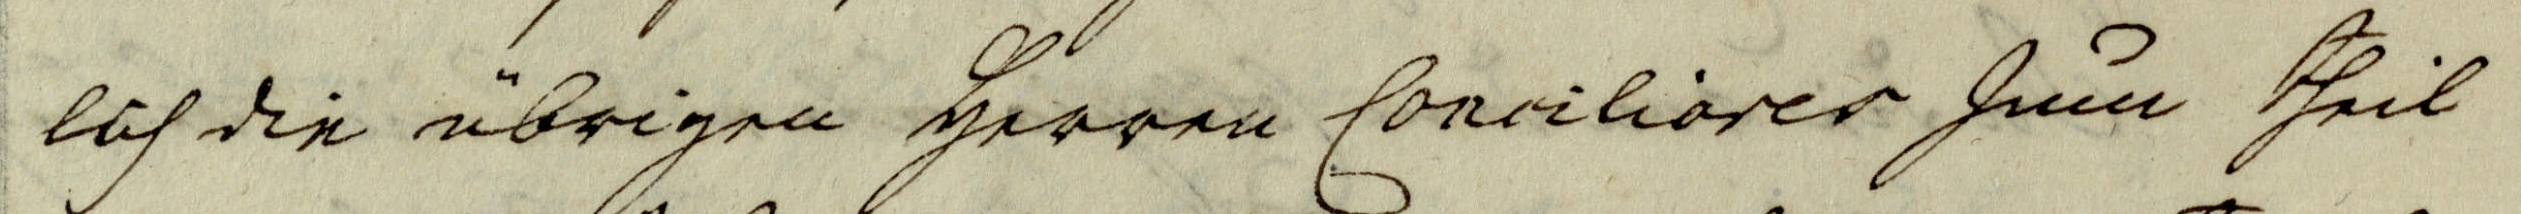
lich die übrigen Herren Conciliares zum Theil
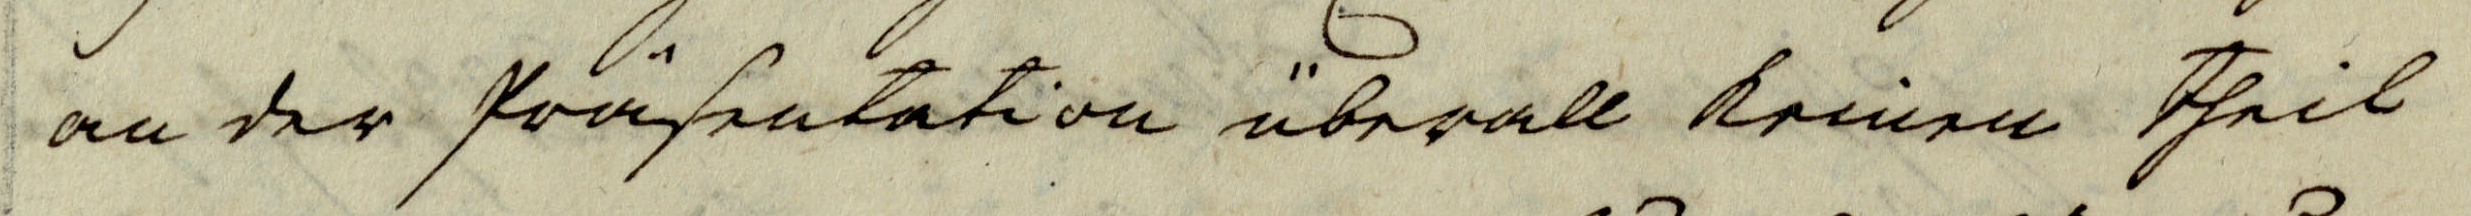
an der Präsentation überall keinen Theil
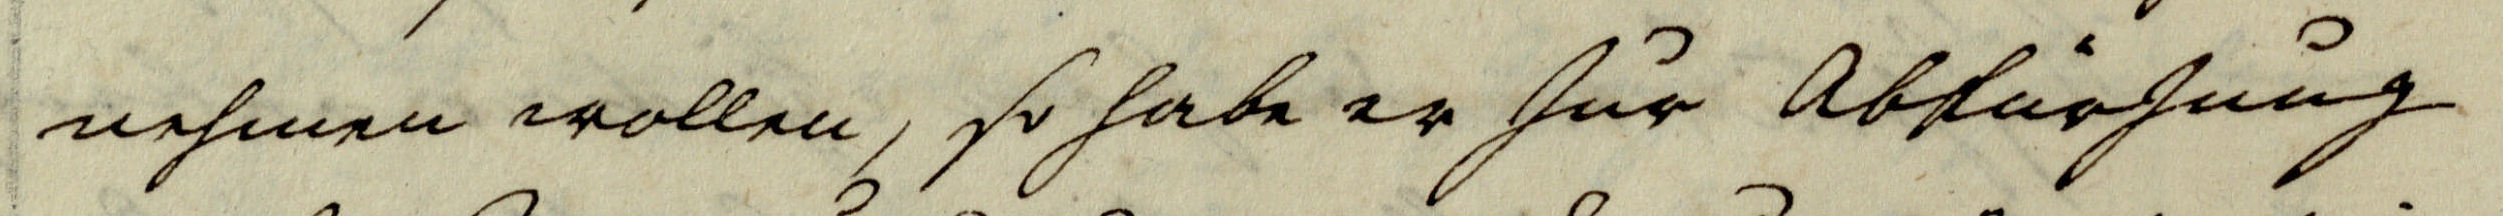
nehmen wollen, so habe er zur Abkürzung
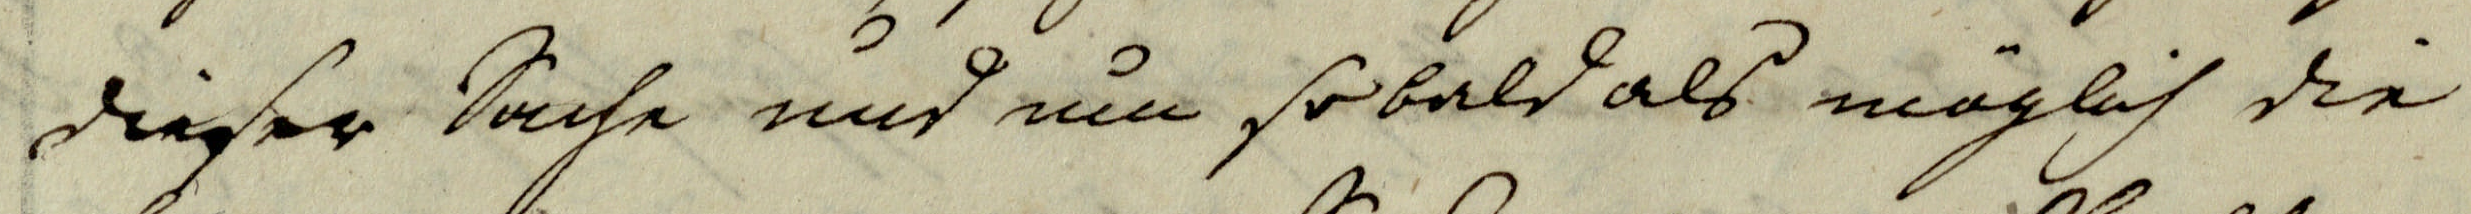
dieser Sache und um sobald als möglich die
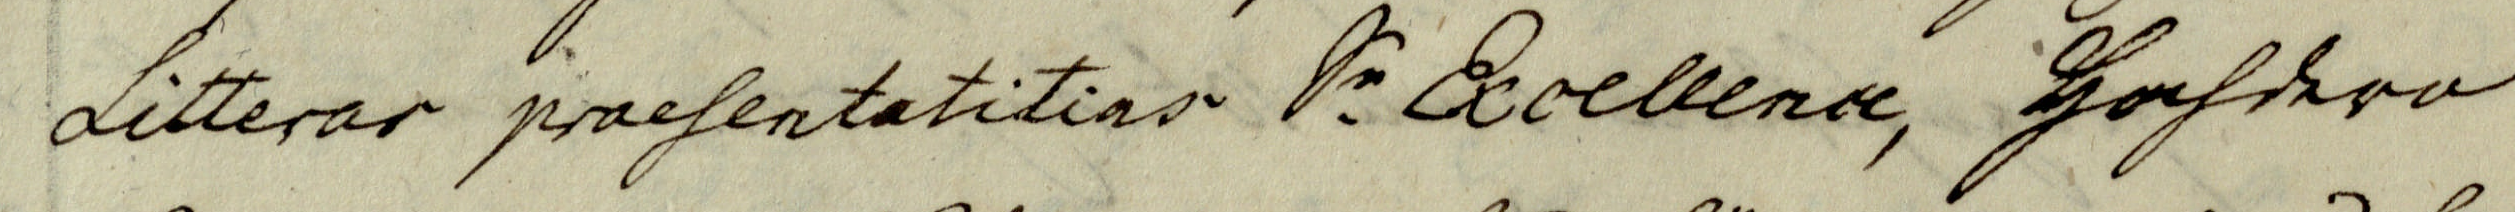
Litteras praesentatitias Sr. Excellence, Hochdero
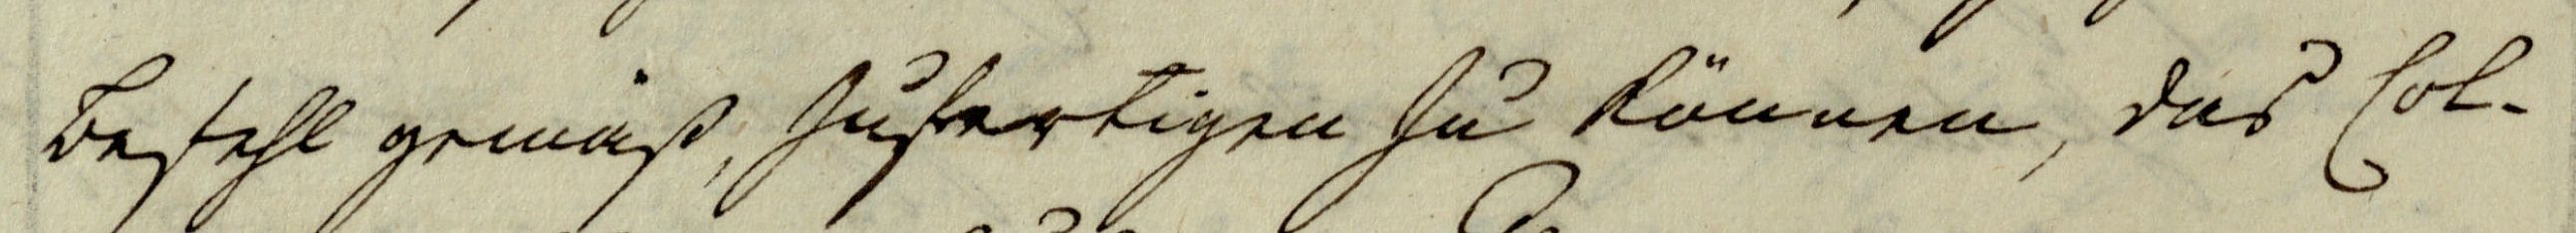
Befehl gemäß, zufertigen zu können, das Col¬
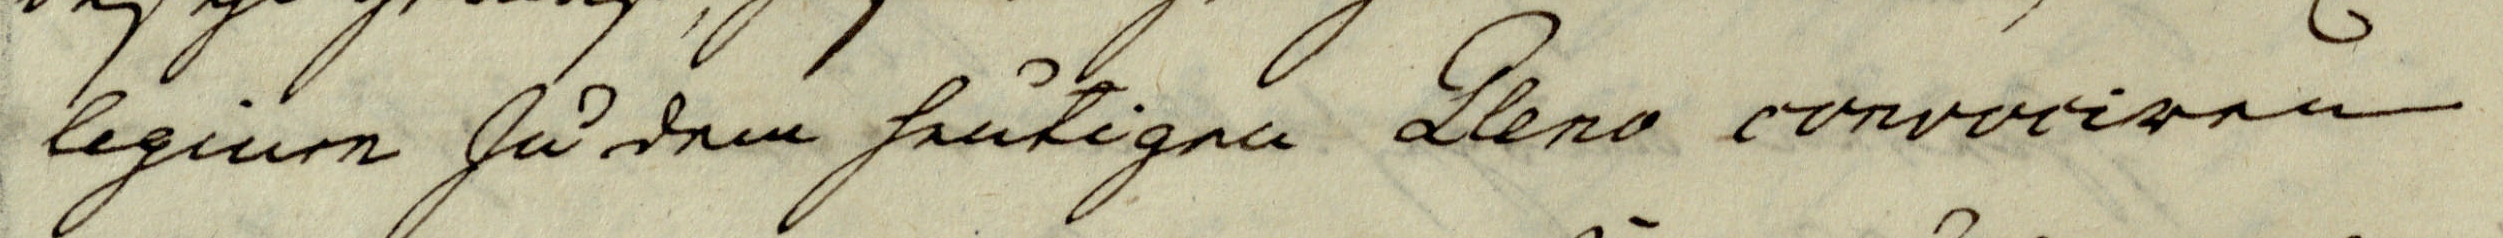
legium zu dem heutigen Pleno convociren
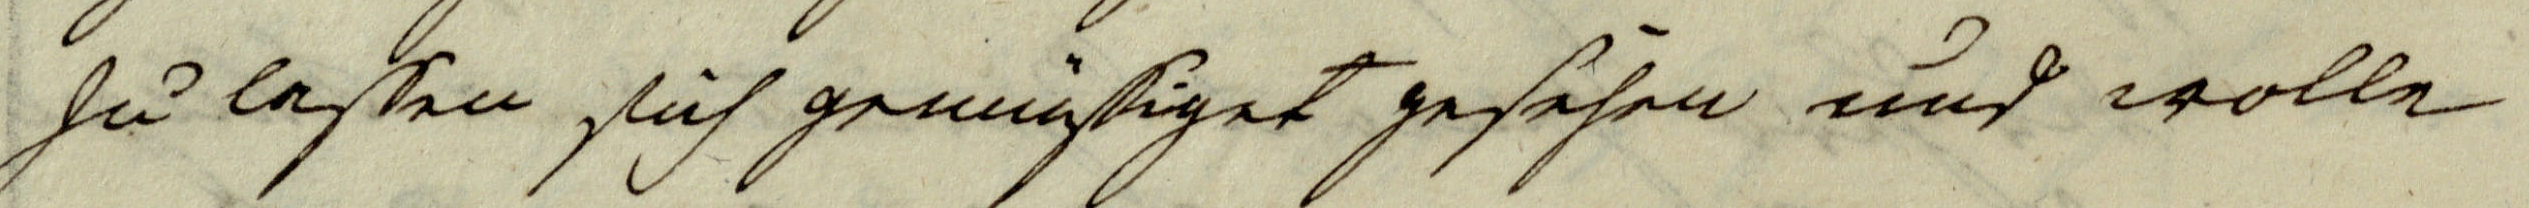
zu lassen sich gemüssiget gesehen und wolle
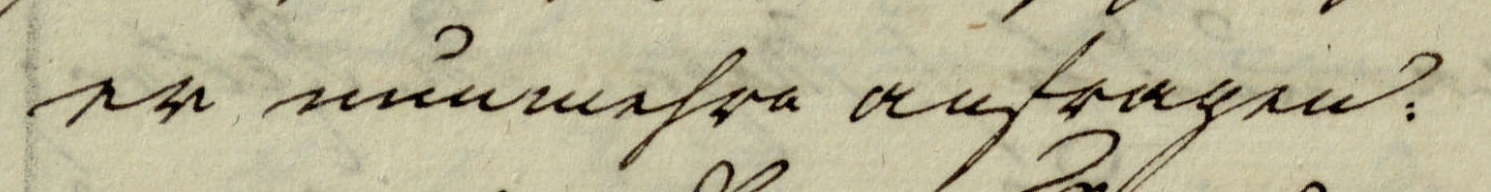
er nunmehro anfragen:
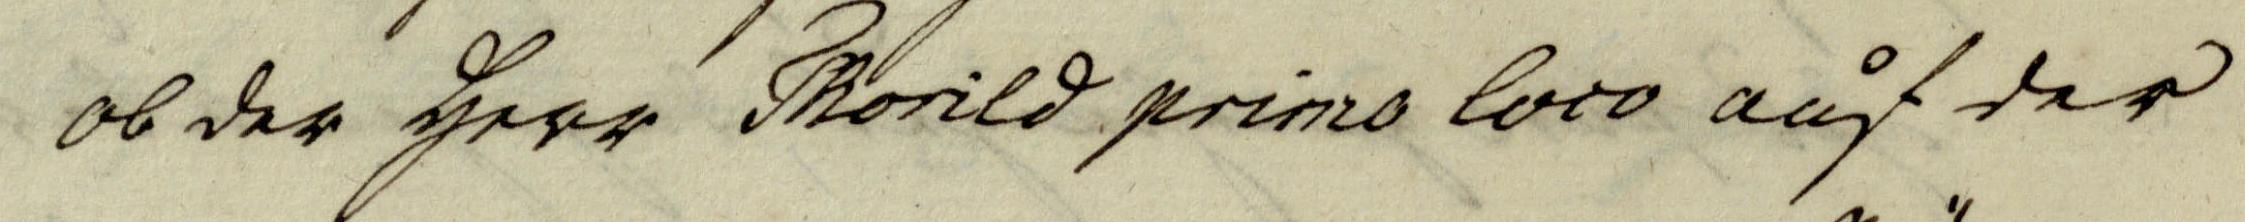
ob der Herr Thorild primo loco auf der
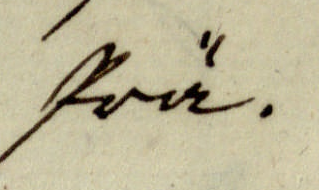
Prä¬
